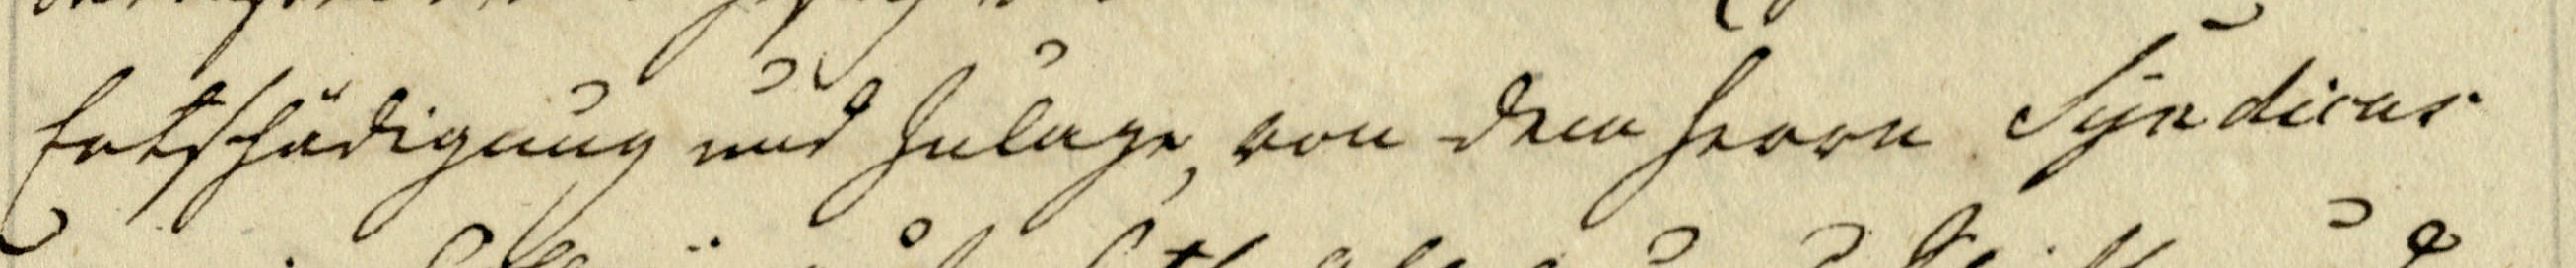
Entschädigung und Zulage, von dem Herrn Sÿndicus
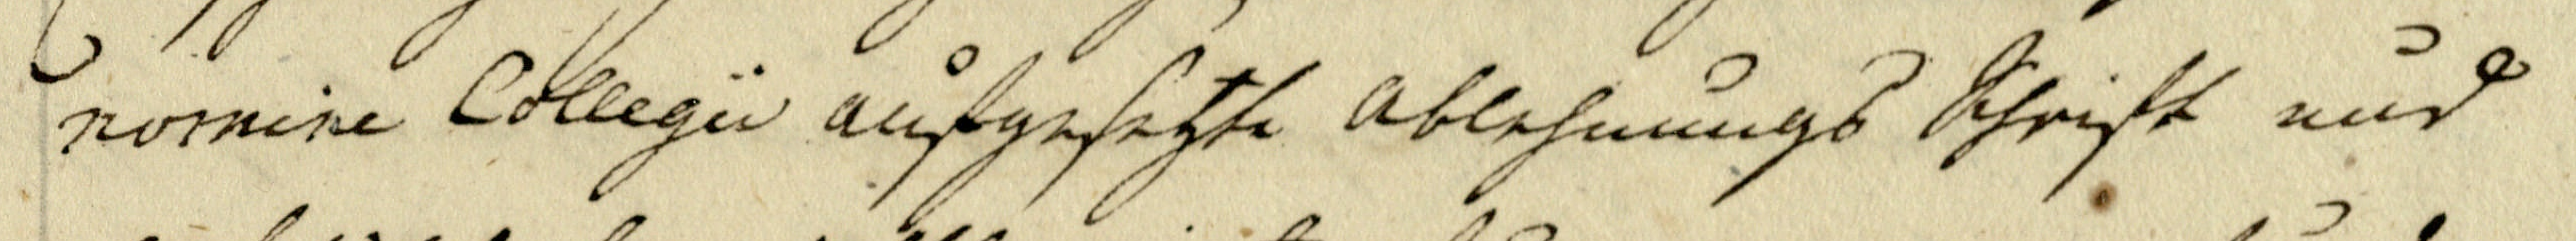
nomine Collegii aufgesetzte Ablehnungs Schrift und
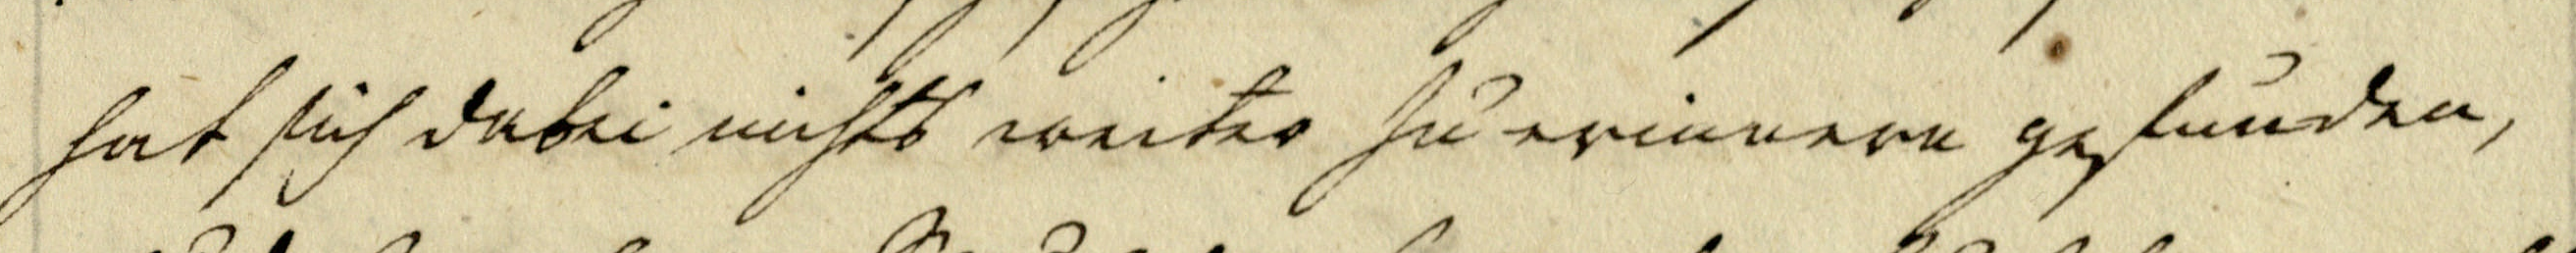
hat sich dabei nichts weiter zu erinnern gefunden,
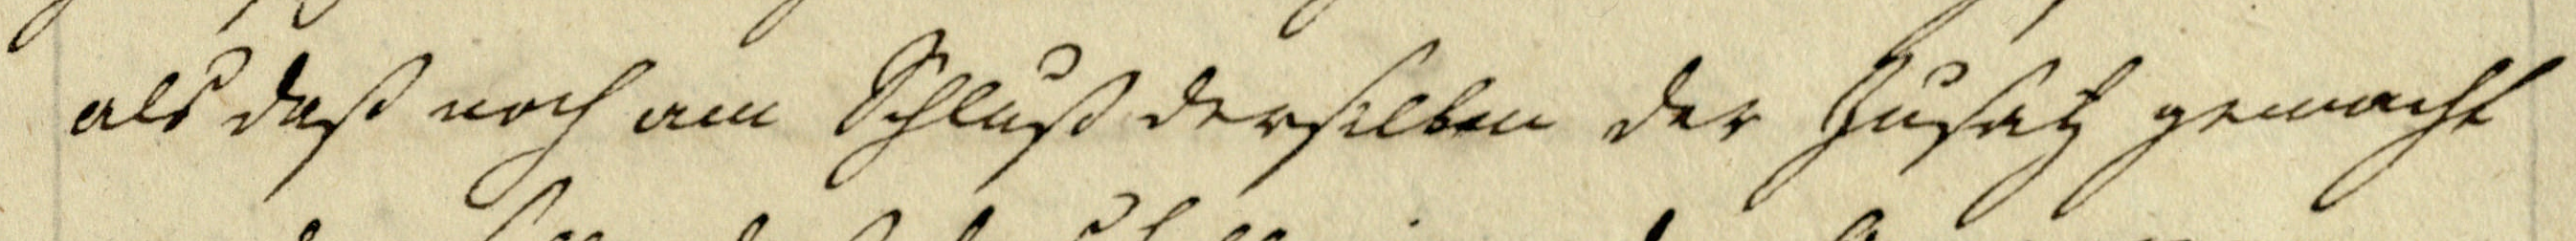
als daß noch am Schluß derselben der Zusatz gemacht
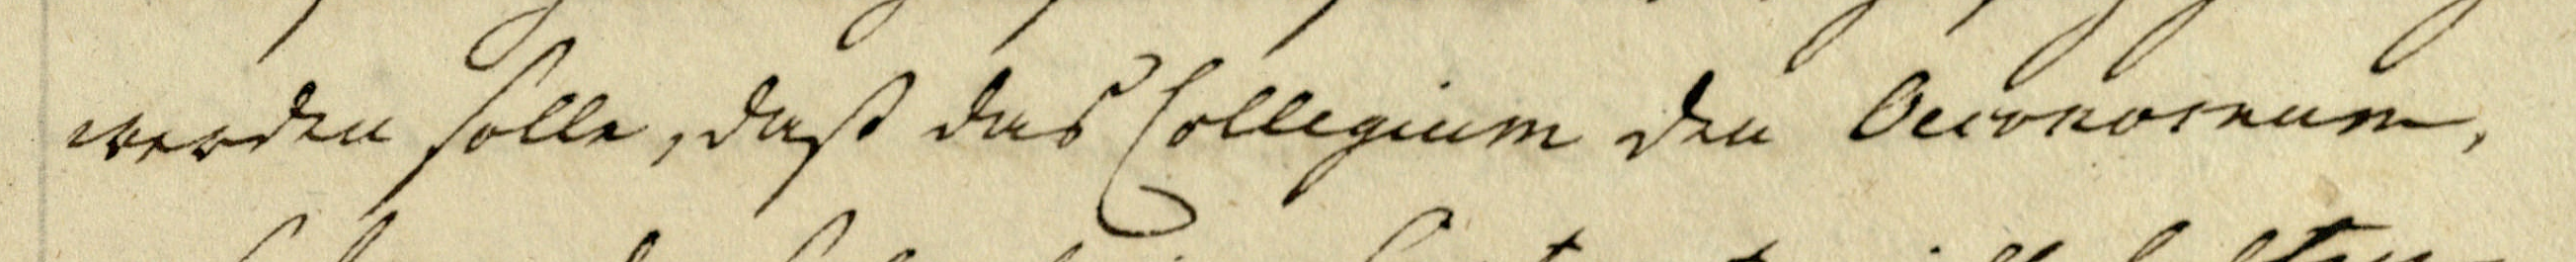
werden solle, daß das Collegium den Oeconomum,
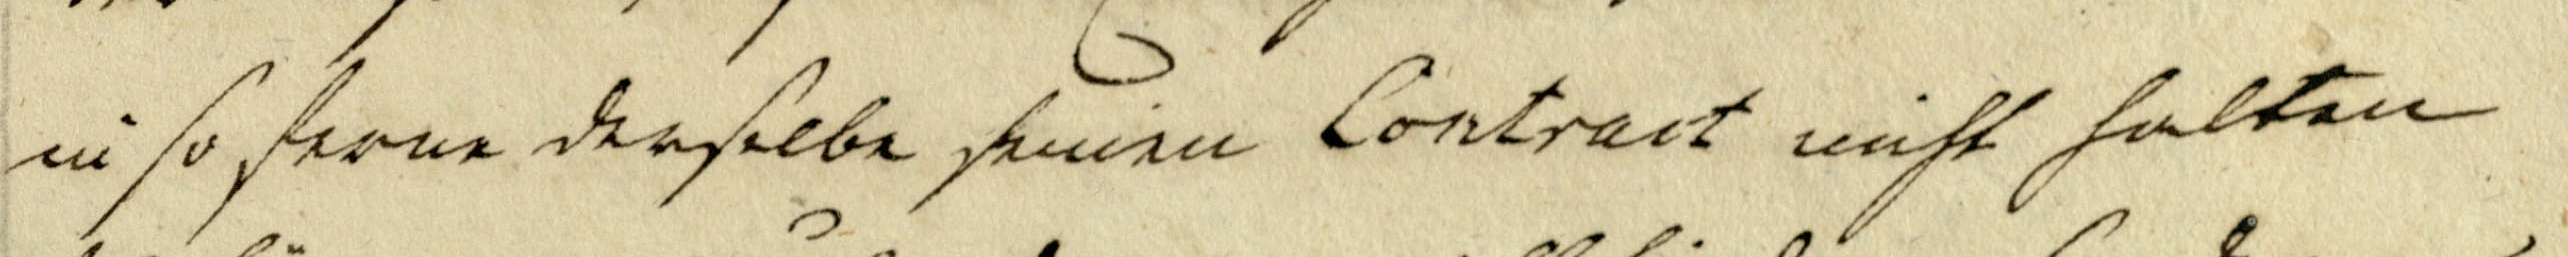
in so ferne derselbe seinen Contract nicht halten
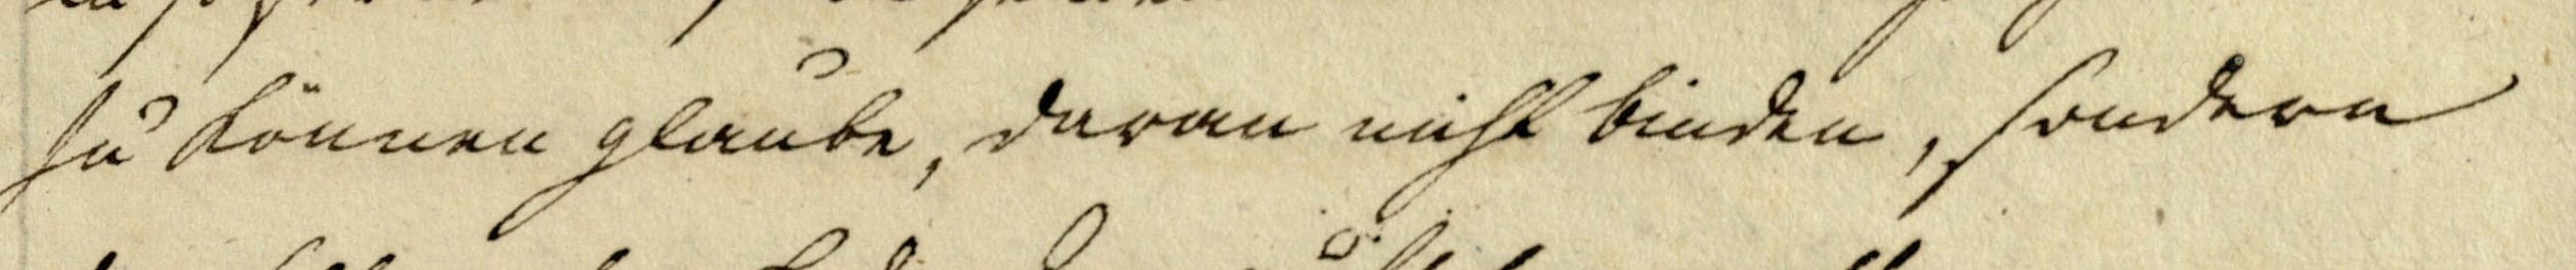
zu können glaube, daran nicht binden, sondern
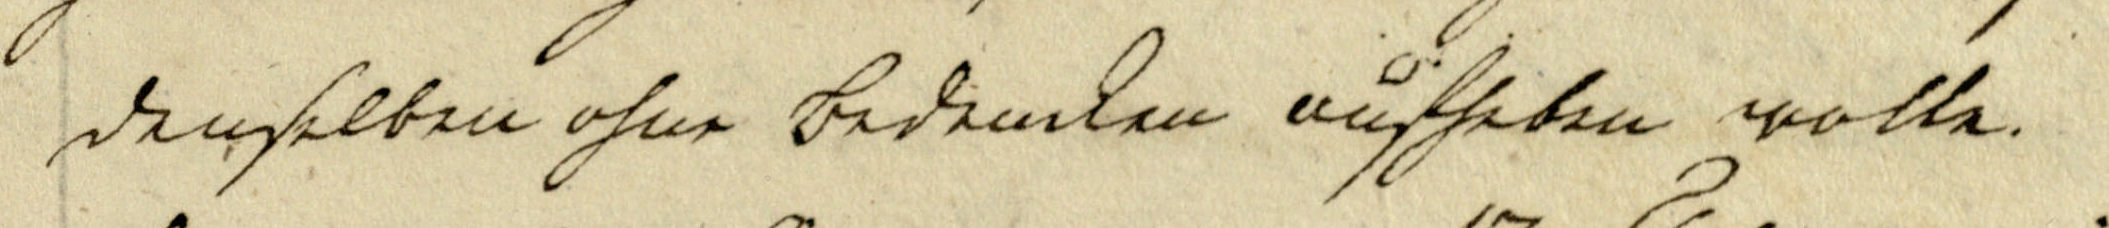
denselben ohne Bedencken aufheben wolle.
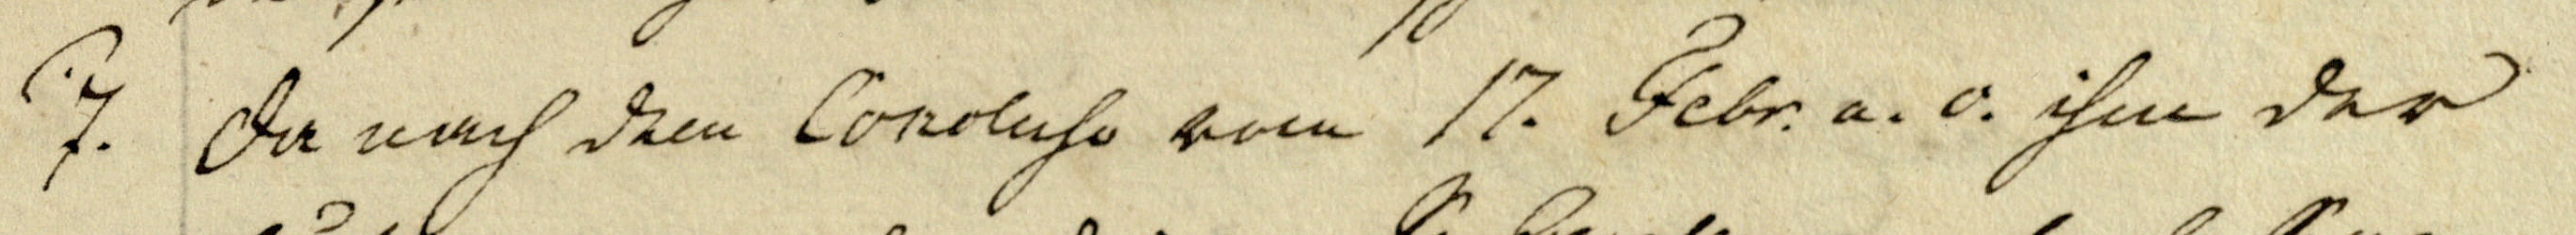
7. Da nach dem Concluso vom 17. Febr. a. c. ihm der
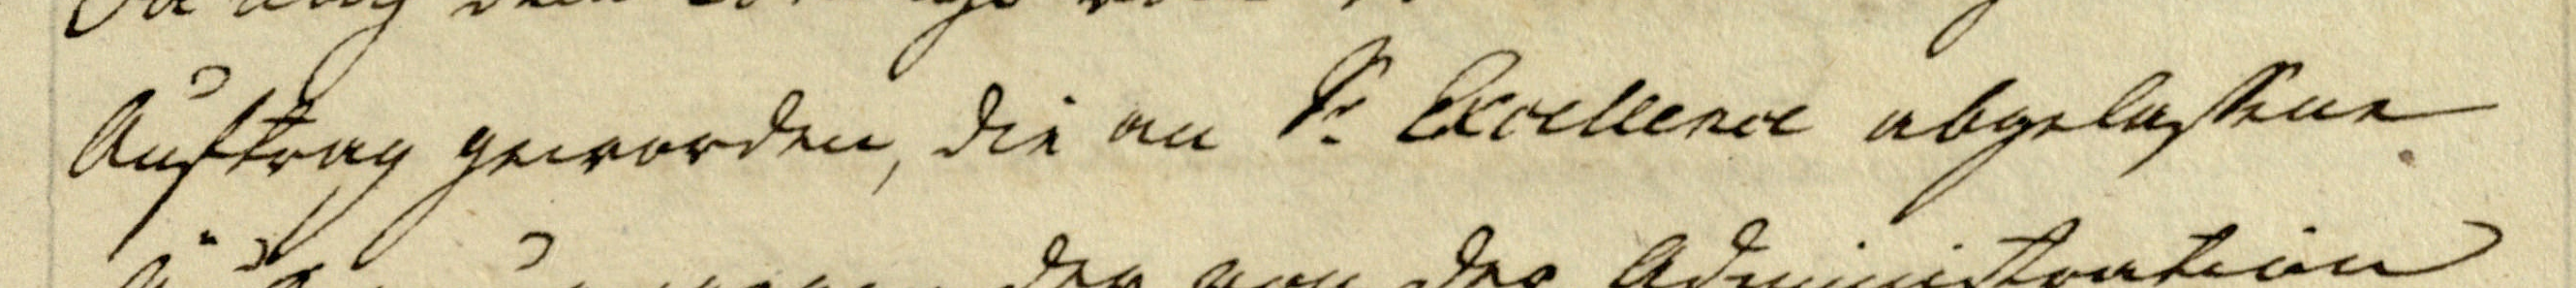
Auftrag geworden, die an Sr Excellence abgelassene
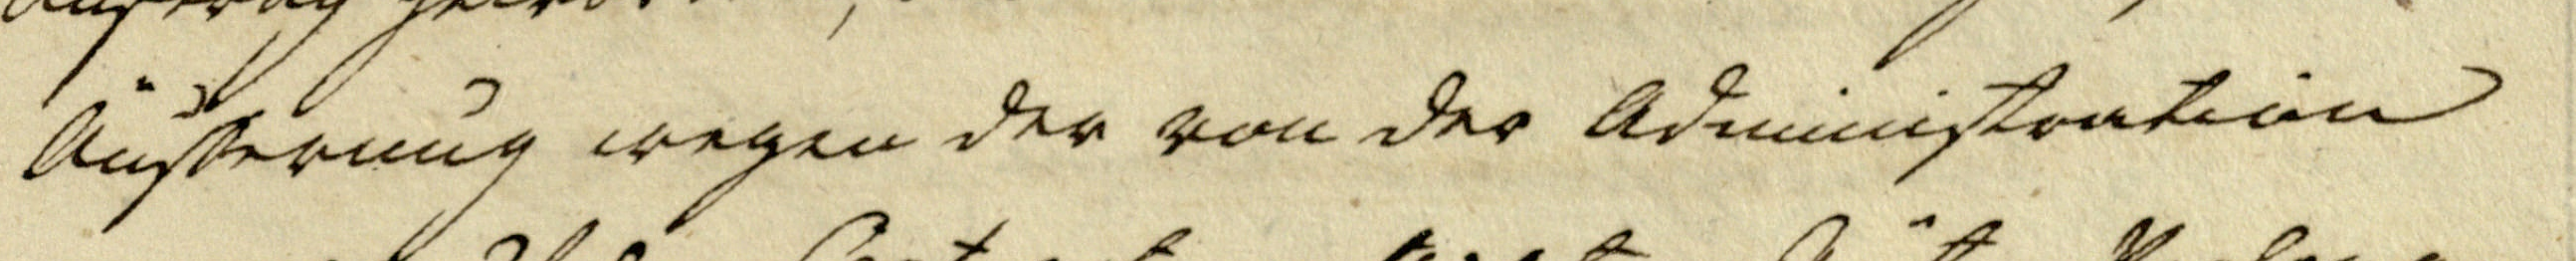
Äusserung wegen der von der Administration
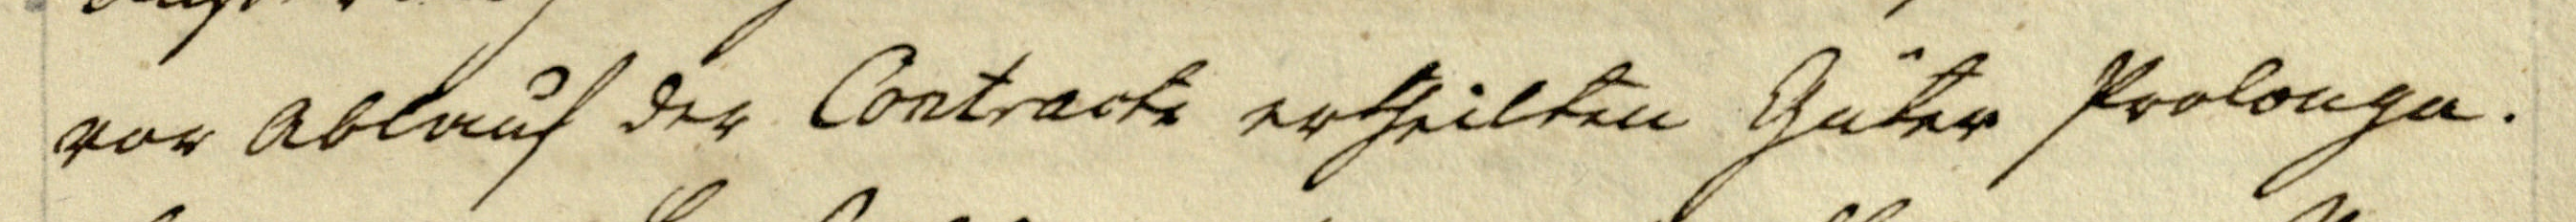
vor Ablauf der Contracte ertheilten Güter Prolonga¬
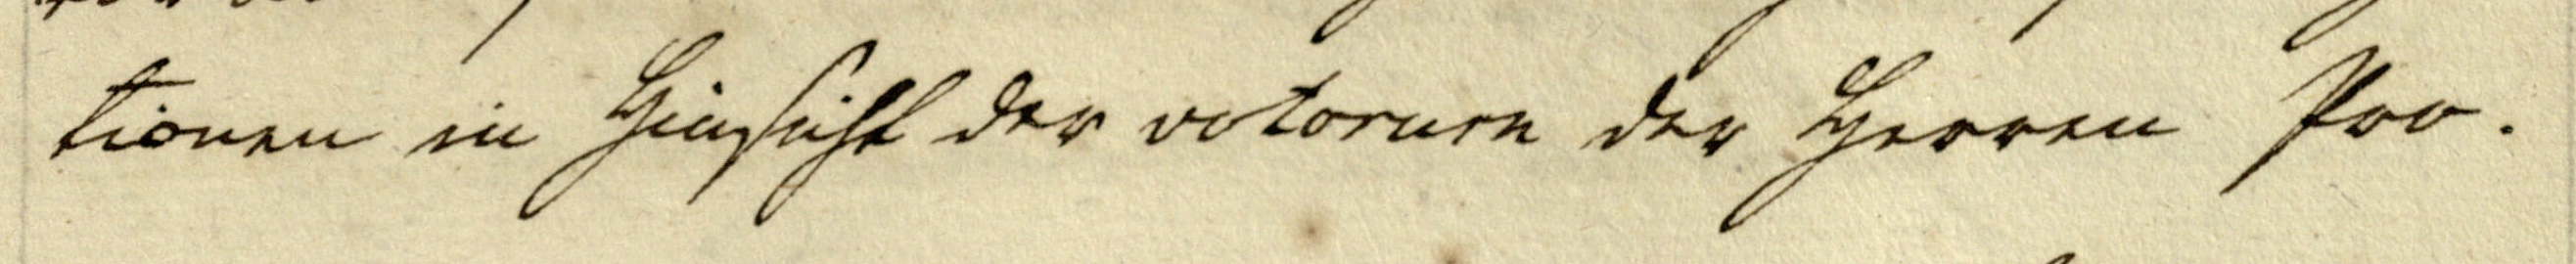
tionen in Hinsicht der votorum der Herren Pro¬
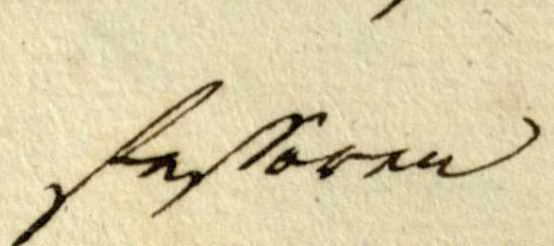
fessoren
